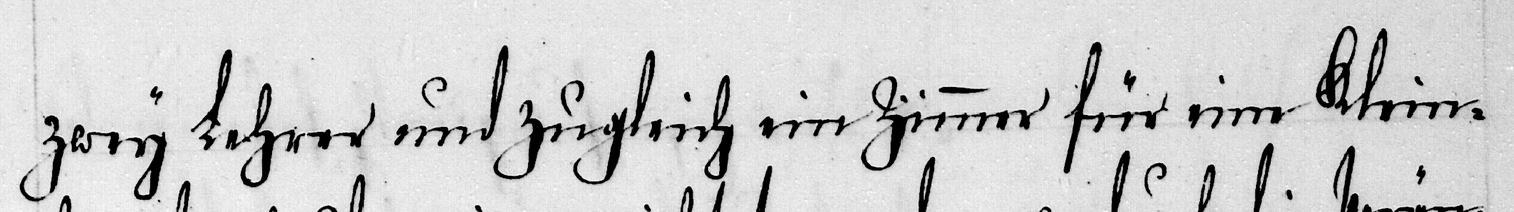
zwey Lehrer und zugleich ein Zimmer für eine Klein¬
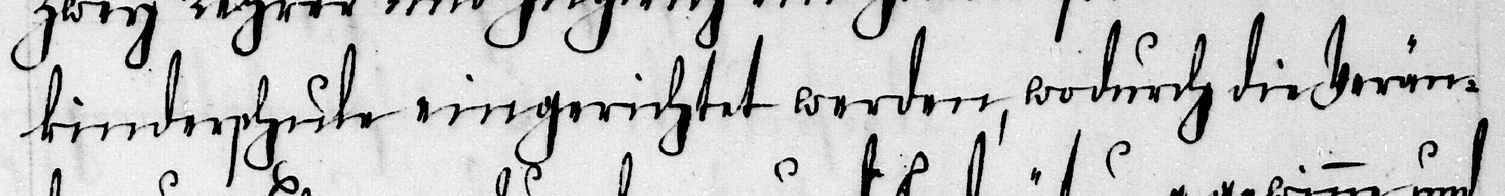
kinderschule eingerichtet werden, wodurch die Verän¬
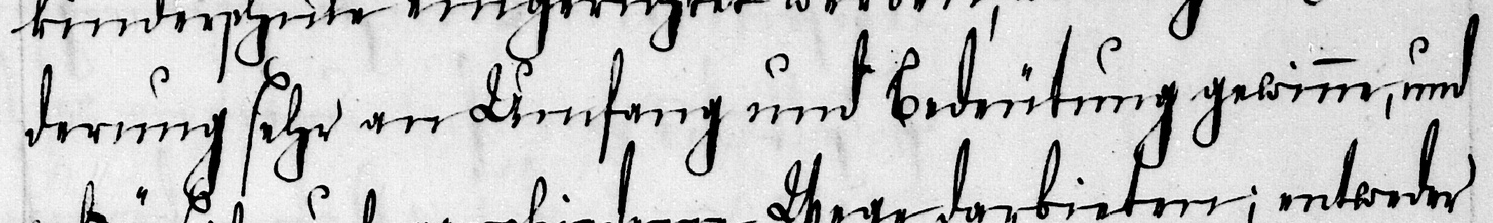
derung sehr an Umfang und Bedeutung gewinne, und
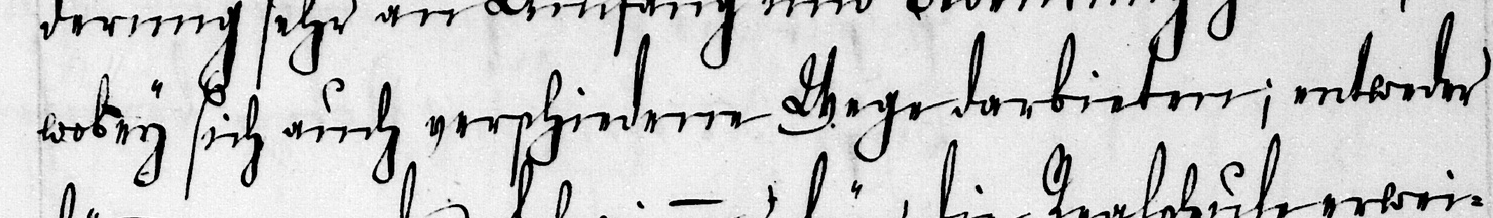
wobey sich auch verschiedene Wege darbieten; entweder
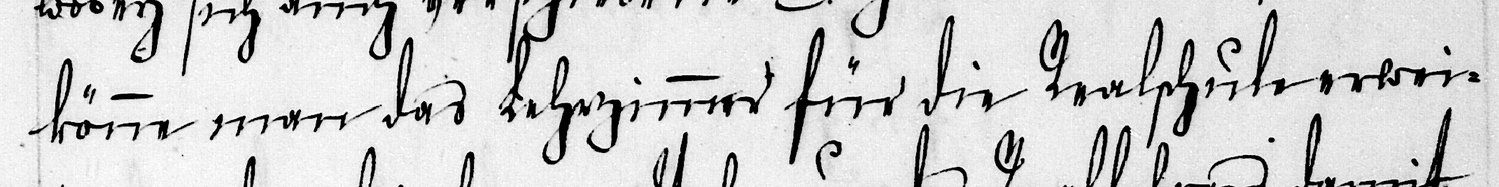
könne man das Lehrzimmer für die Realschule erwei¬
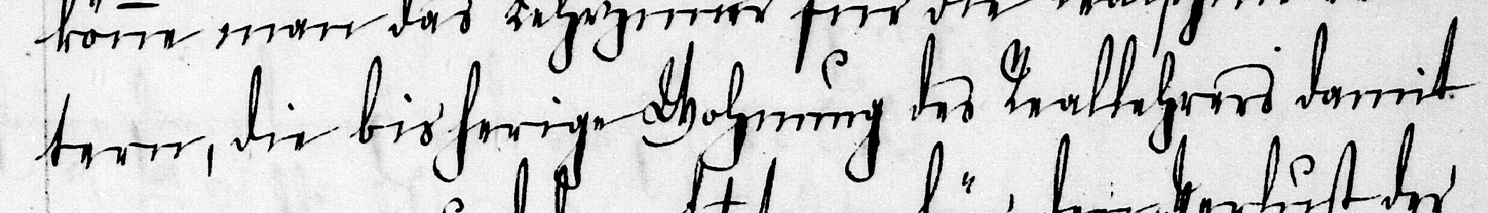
tern, die bisherige Wohnung des Reallehrers damit
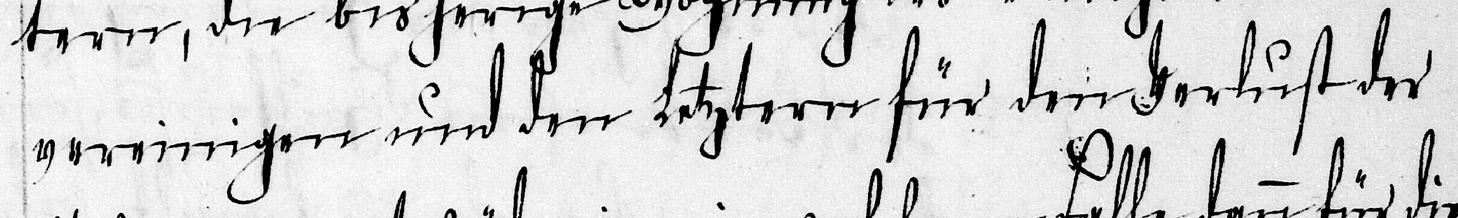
vereinigen und den Letztern für den Verlust der
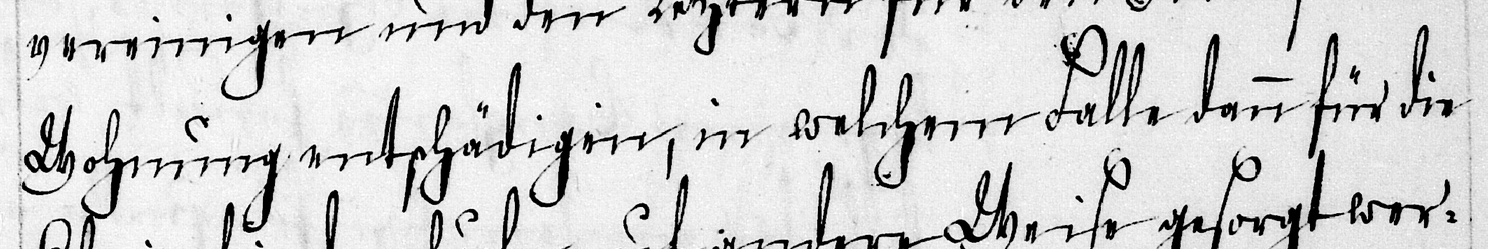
Wohnung entschädigen, in welchem Falle dann für die
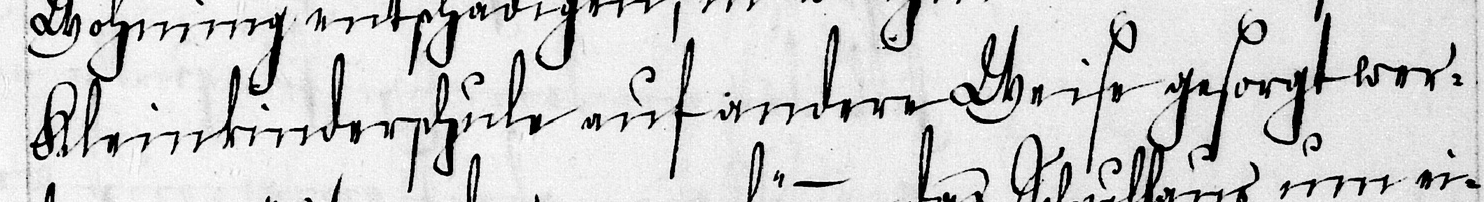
Kleinkinderschule auf andere Weise gesorgt wer¬
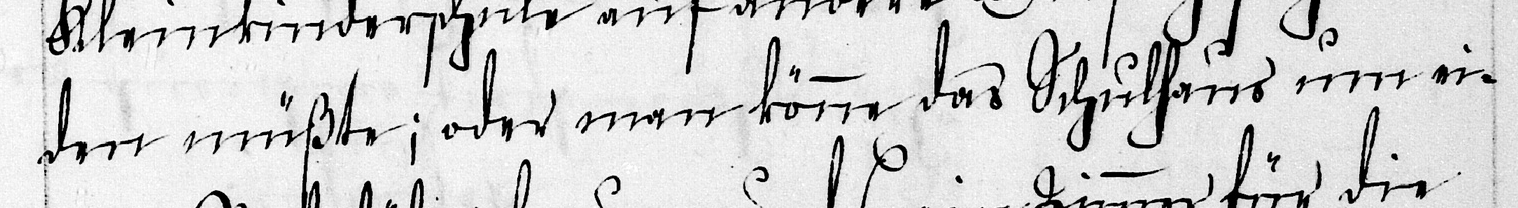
den müßte; oder man könne das Schulhaus um ei¬
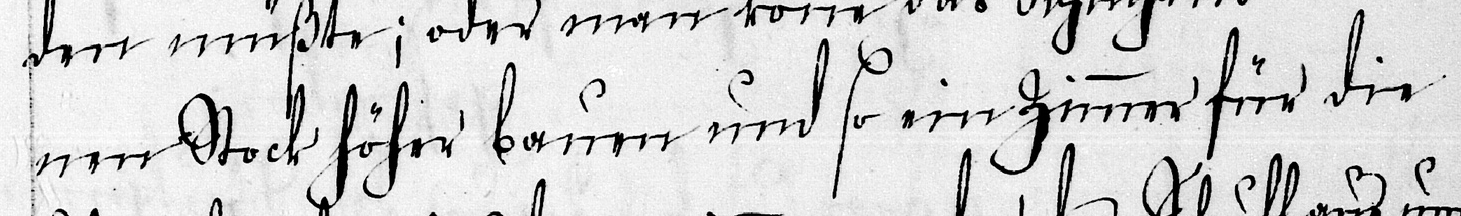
nen Stock höher bauen und so ein Zimmer für die
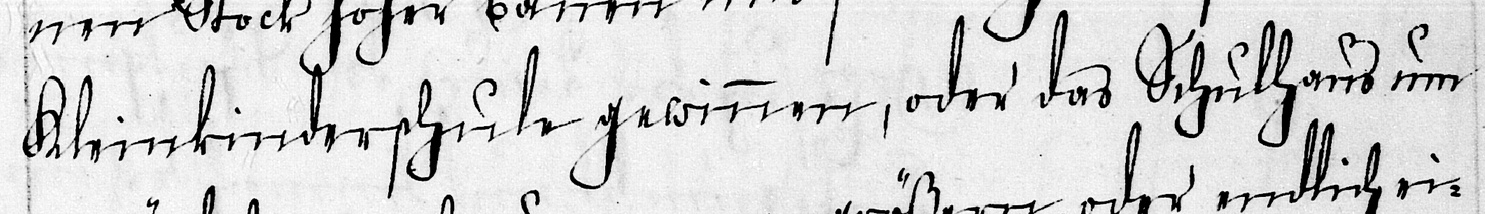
Kleinkinderschule gewinnen, oder das Schulhaus um
